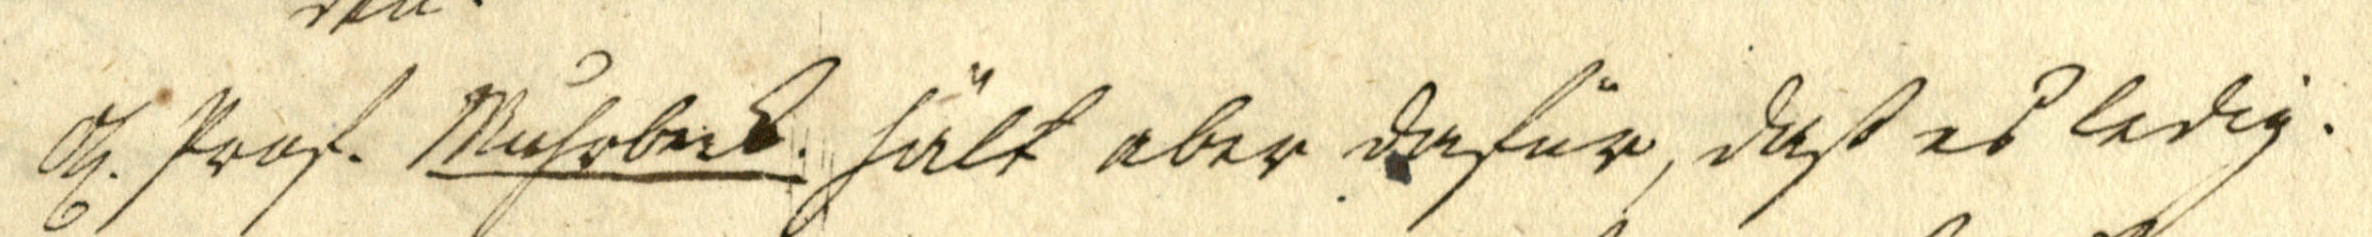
dh. Prof. Muhrbeck hält aber dafür, daß es ledig¬
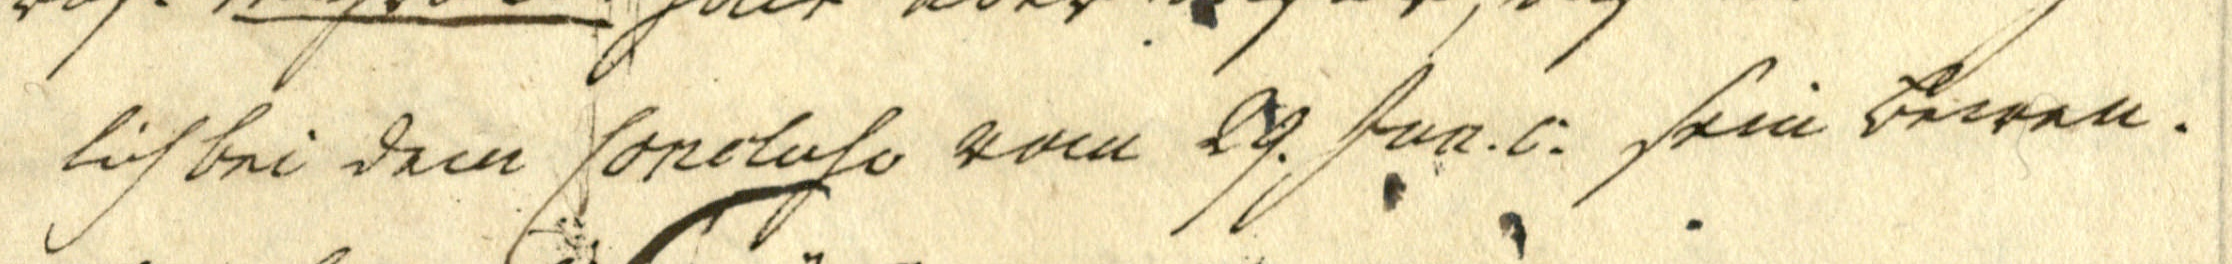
lich bei dem Concluso vom 29. Jun. c. sein Bewen¬
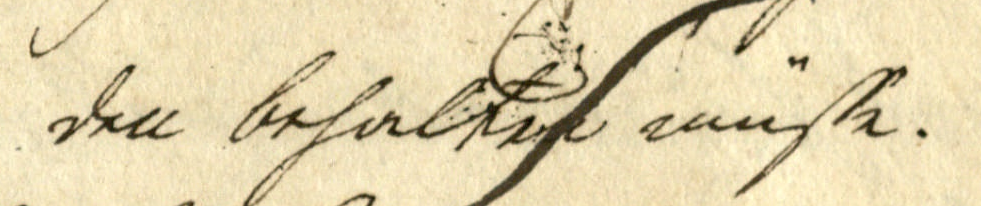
den behalten müsse.
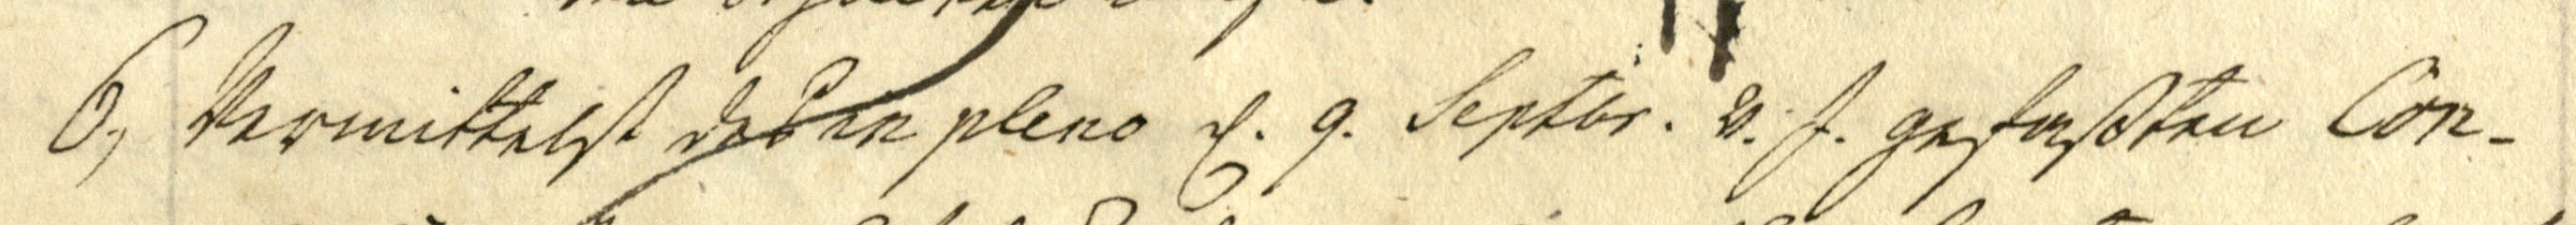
6, Vermittelst des in pleno l. 9. Septbr. v. J. gefaßten Con¬
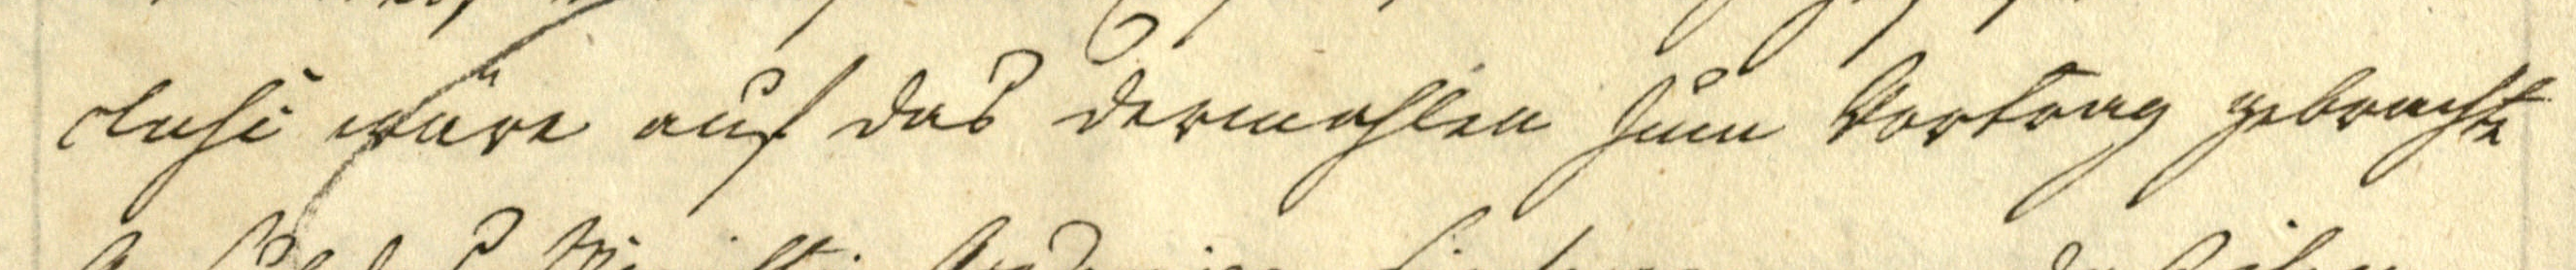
clusi wäre auf das dermalen zum Vortrag gebrachte
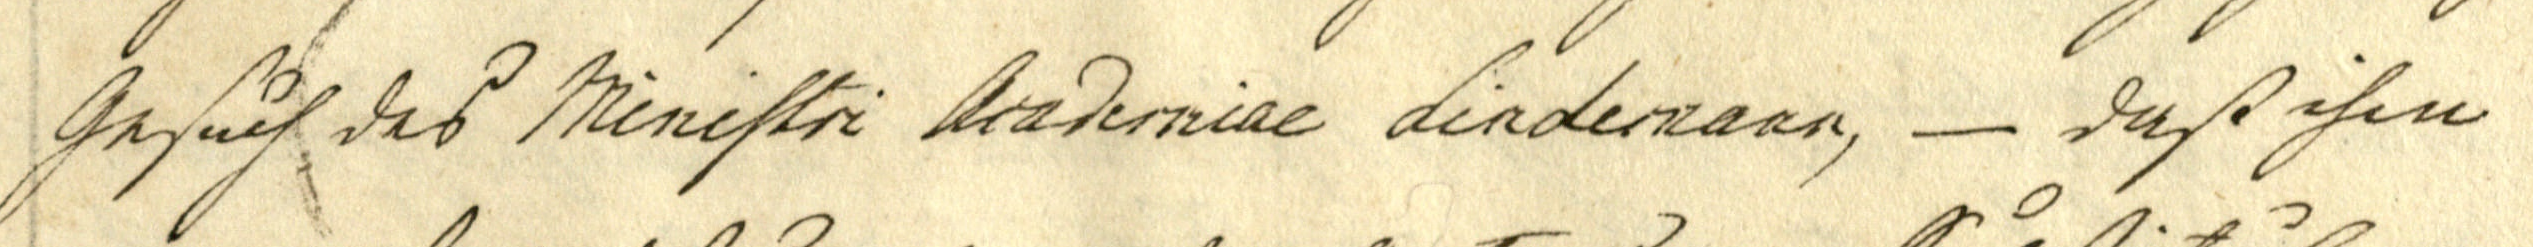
Gesuch des Ministri Academiae Lindemann, daß ihm
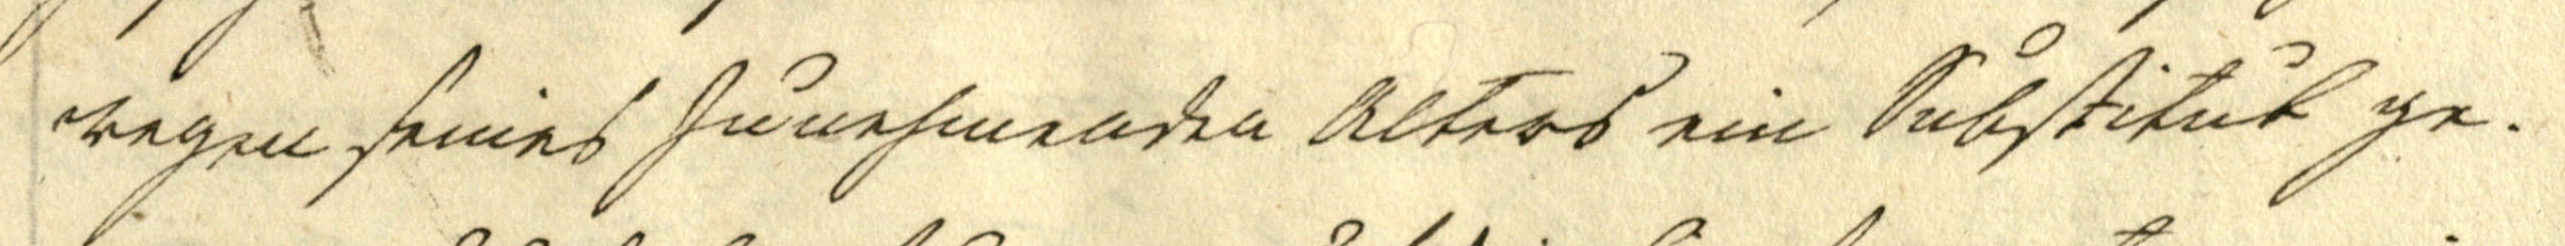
wegen seines zunehmenden Alters ein Substitut ge¬
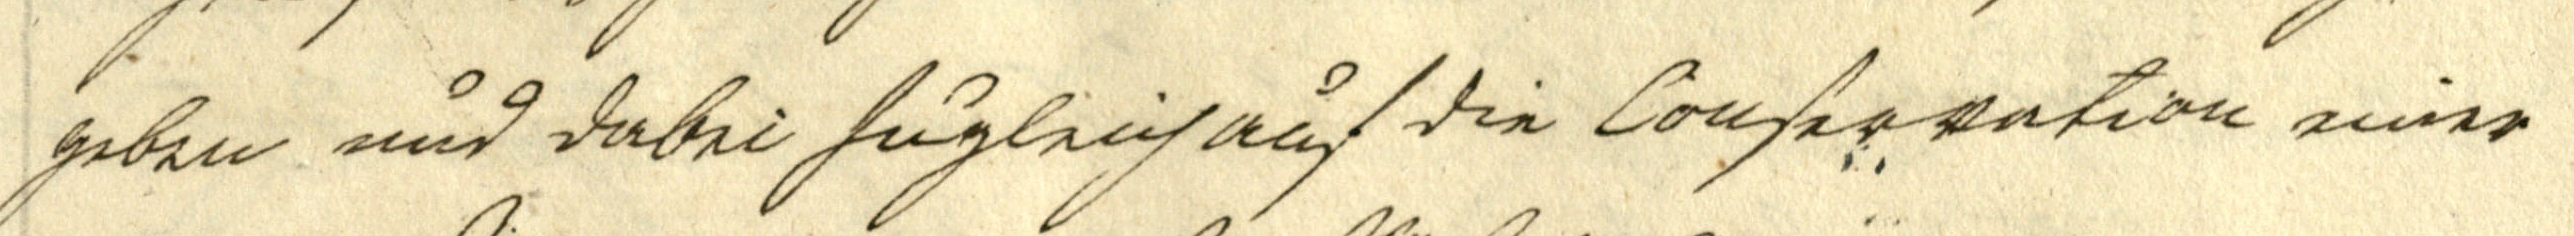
geben und dabei zugleich auf die Conservation einer
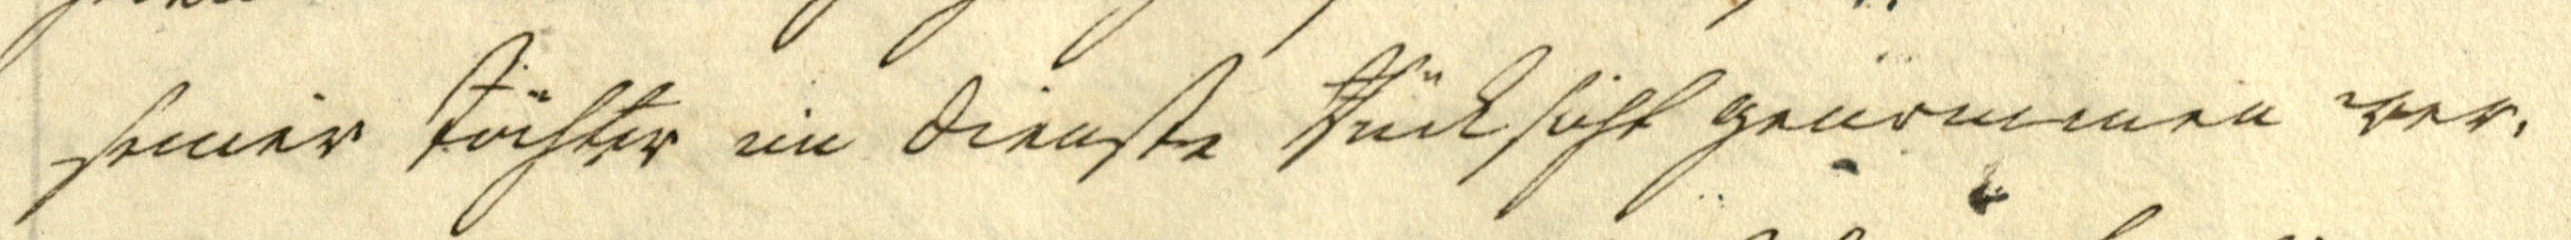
seiner Töchter im dienste Rücksicht genommen wer¬
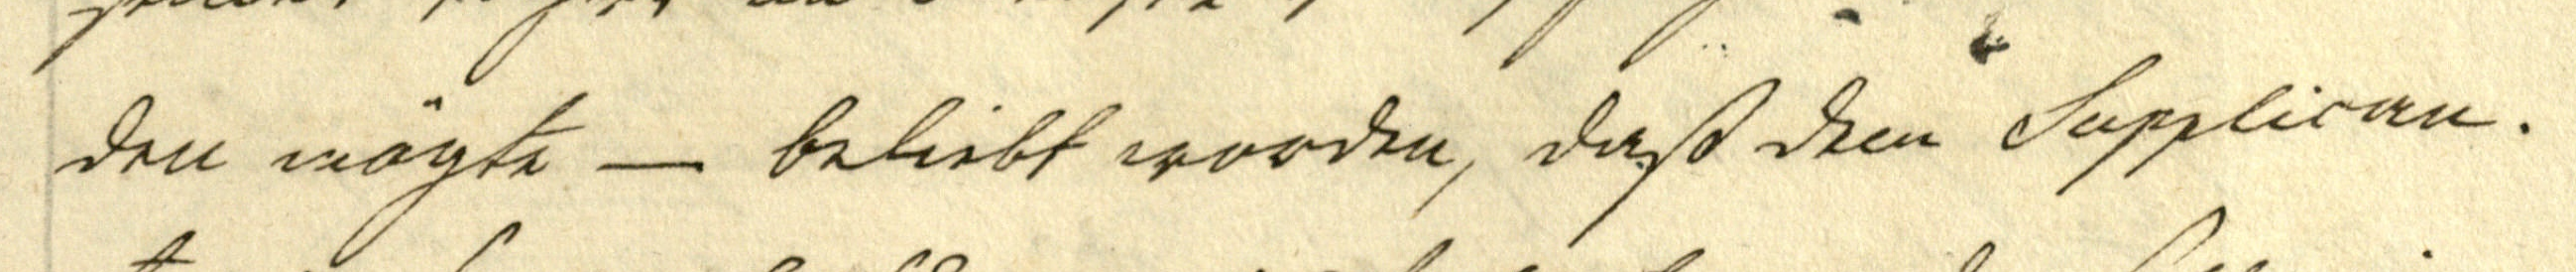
den mögte beliebt worden, daß dem Supplican¬
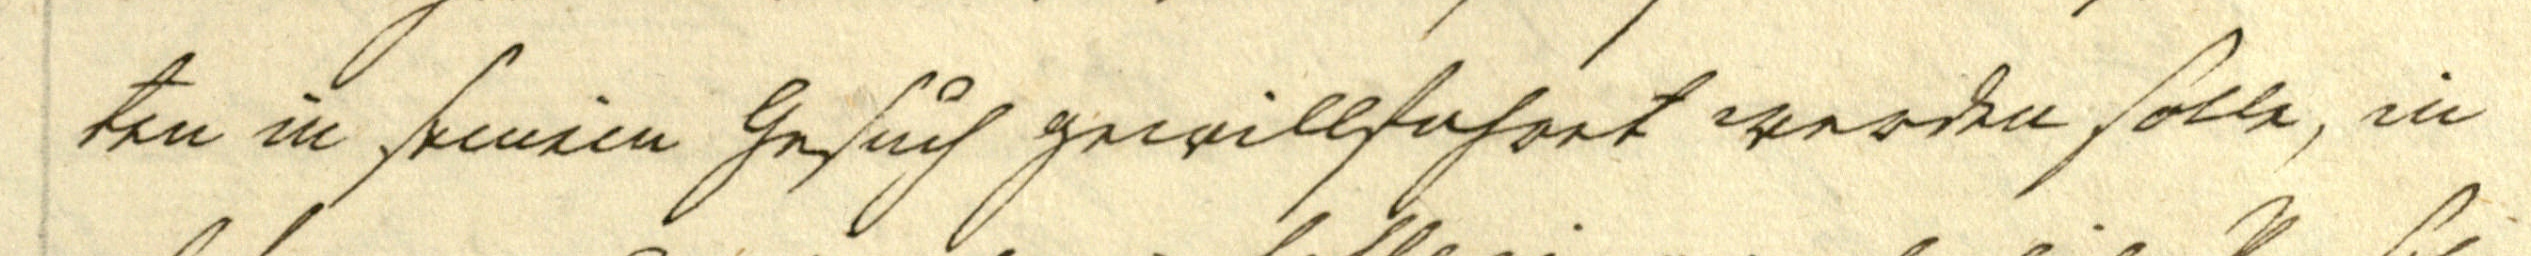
ten in seinem Gesuch gewillfahret werden solle, in
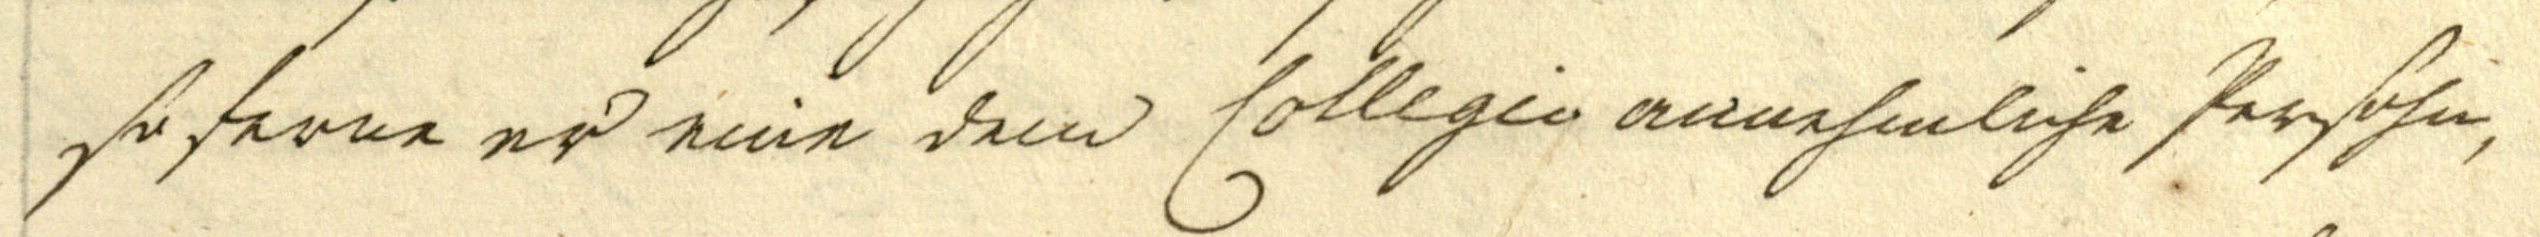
so ferne er eine dem Collegio annehmliche Persohn,
